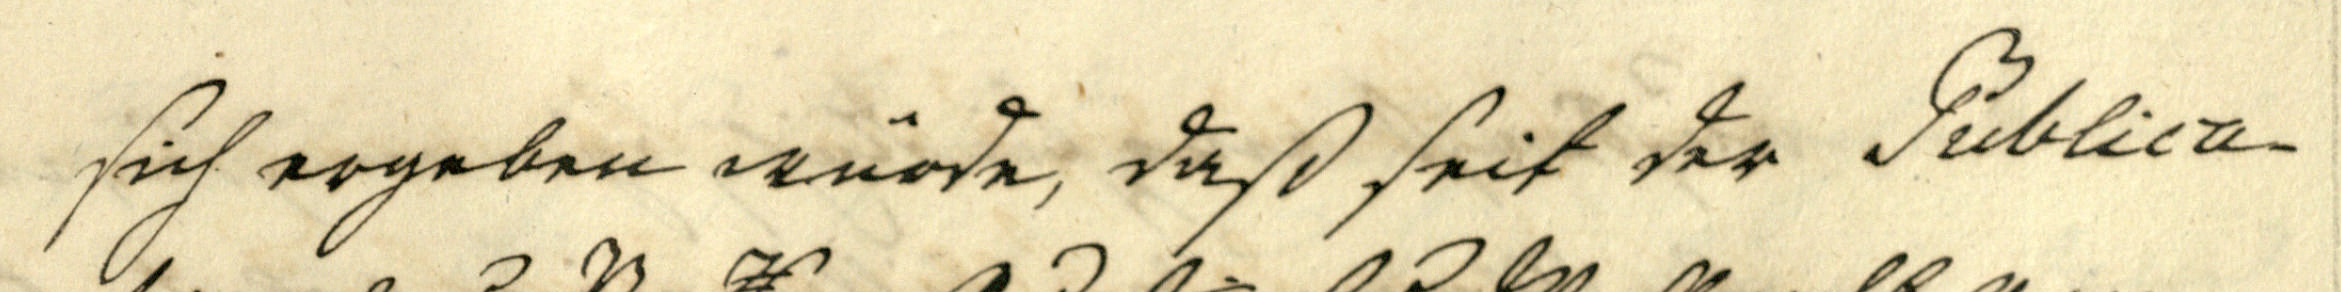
sich ergeben würde, daß seit der Publica¬
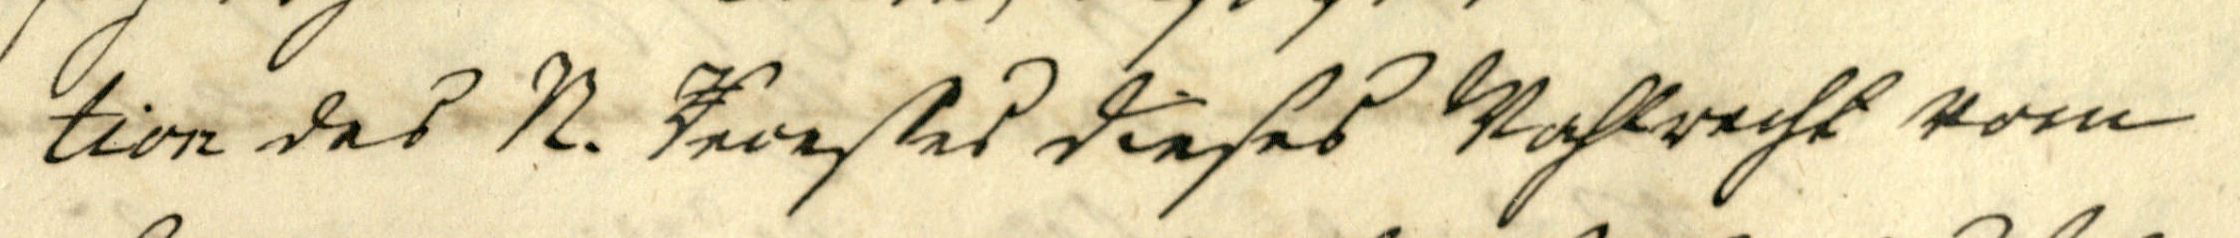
tion des N. Recesses dieses Wahlrecht vom
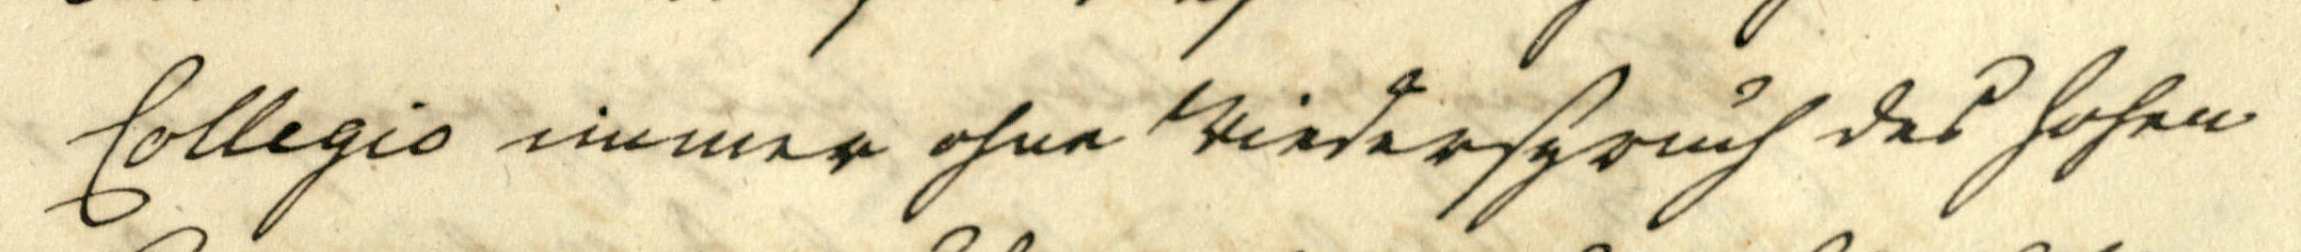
Collegio immer ohne Wiederspruch des hohen
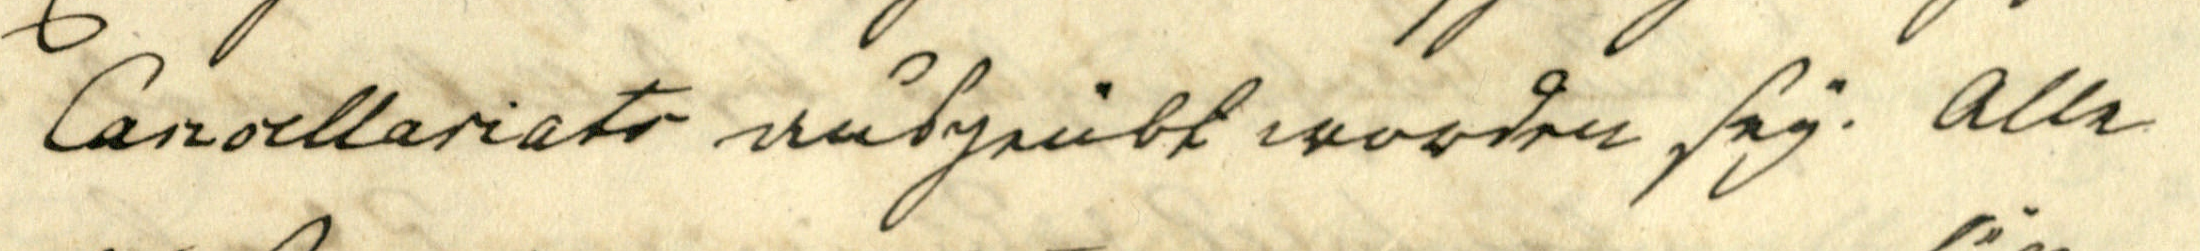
Cancellariats ausgeübt worden seÿ. Alle
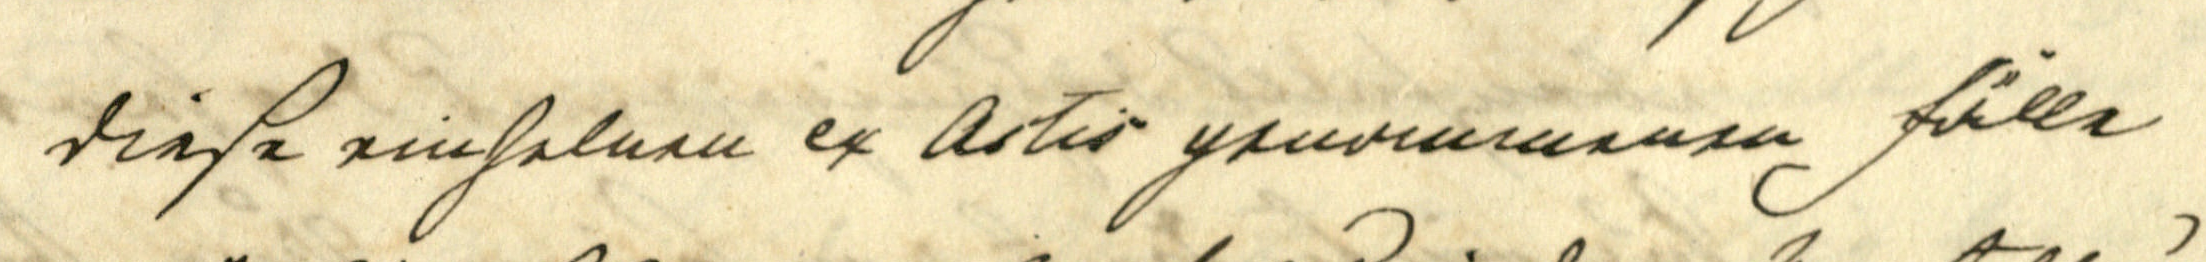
diese einzelnen ex Actis genommenen Fälle
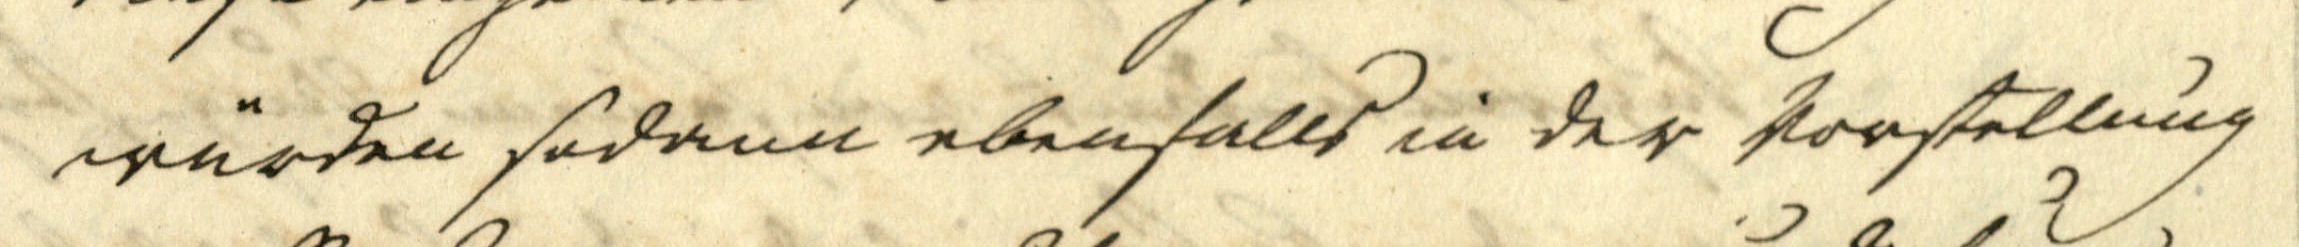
würden sodann ebenfalls in der Vorstellung
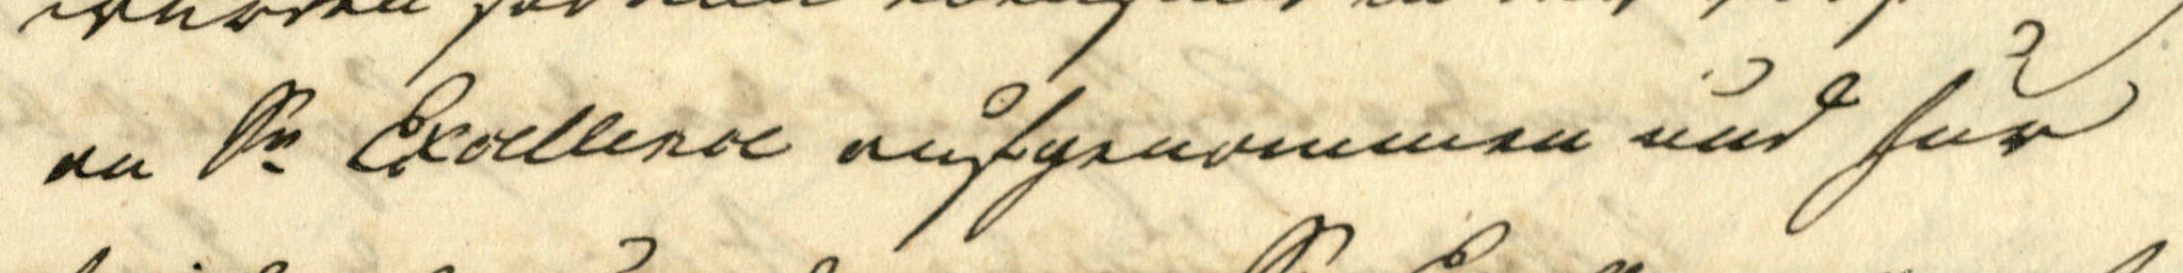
an Sr Excellence aufgenommen und zur
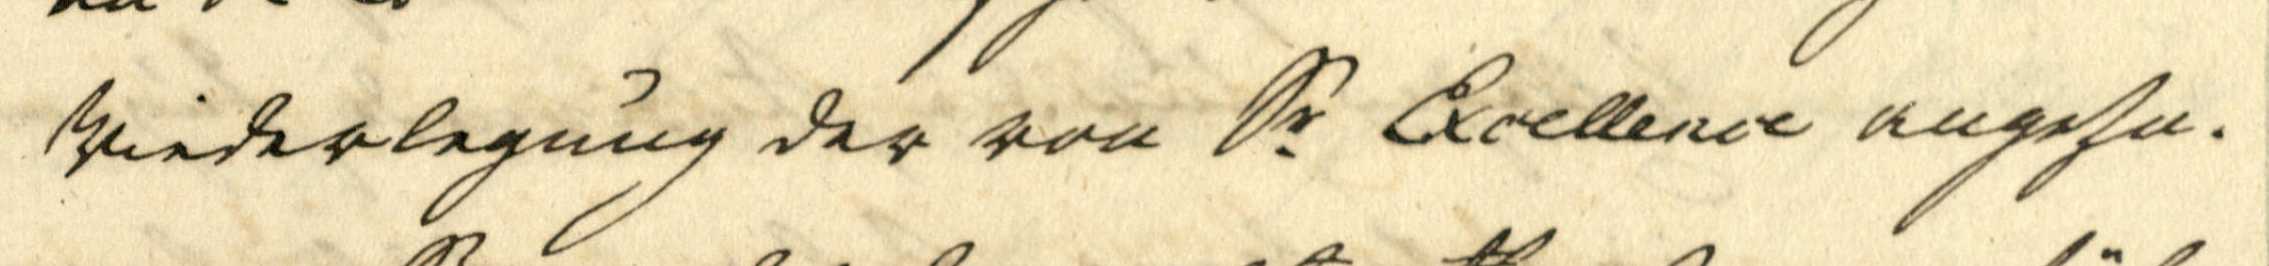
Wiederlegung der von Sr Excellence angezu¬
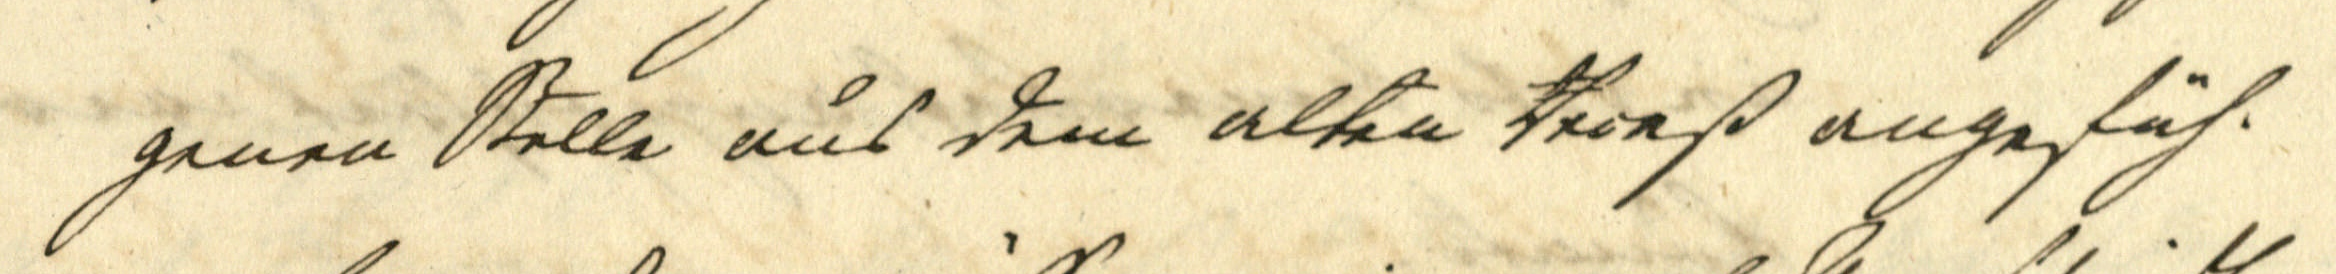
genen Stelle aus dem alten Receß angefüh¬
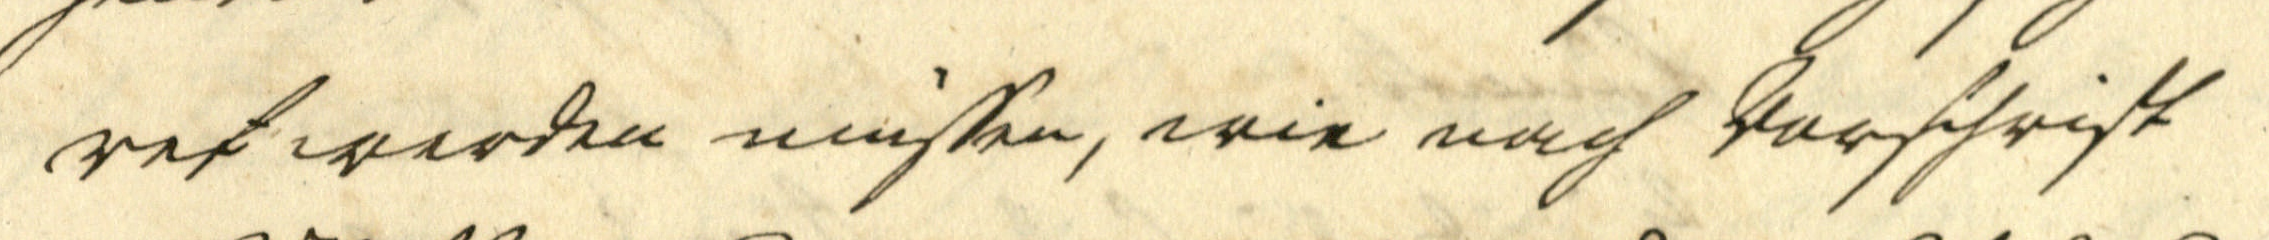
ret werden müssen, wie nach Vorschrift
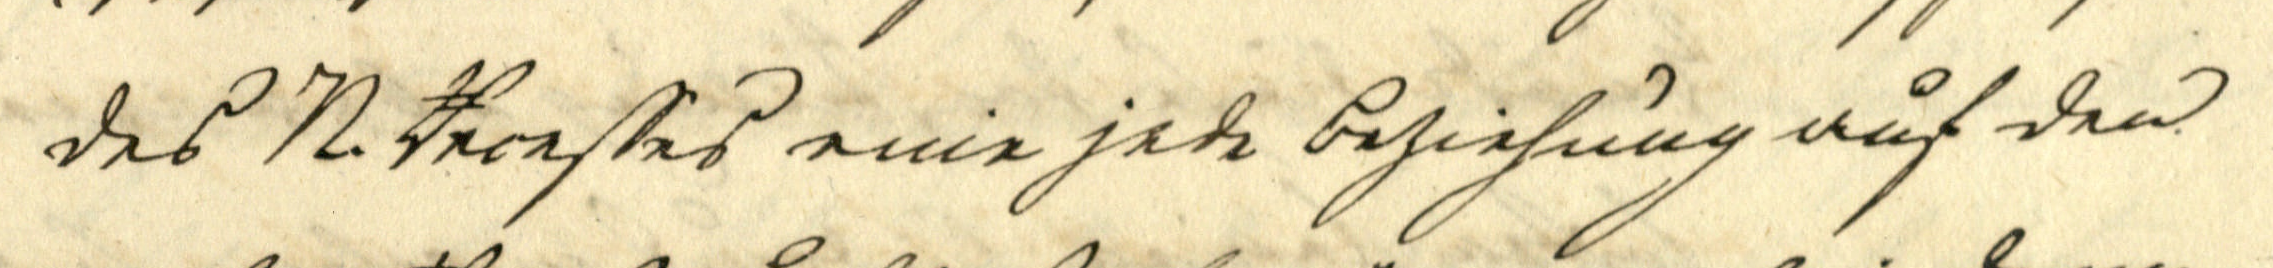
des N. Recesses eine jede Beziehung auf den
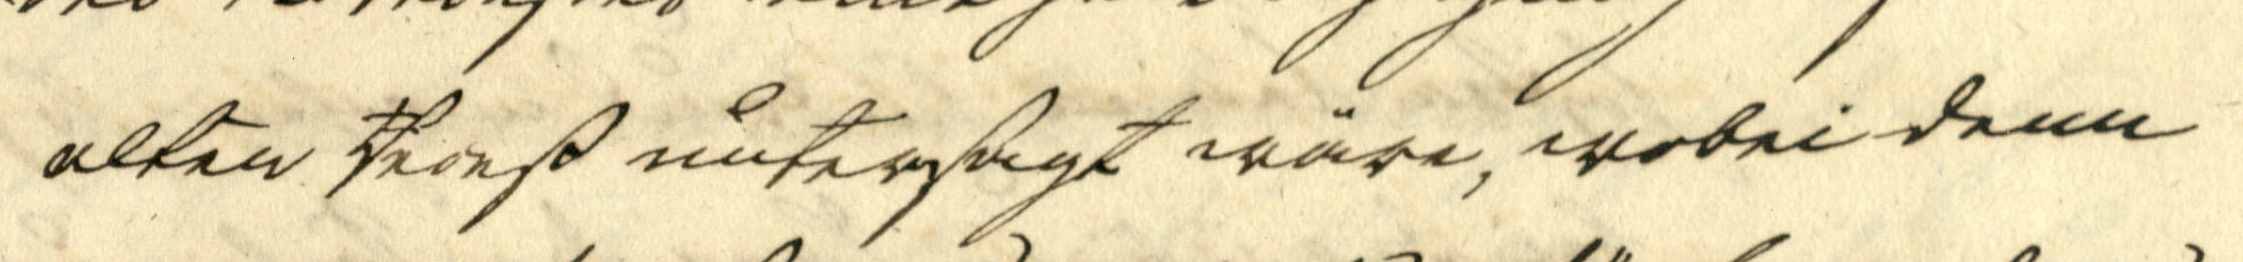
alten Receß untersagt wäre, wobei denn
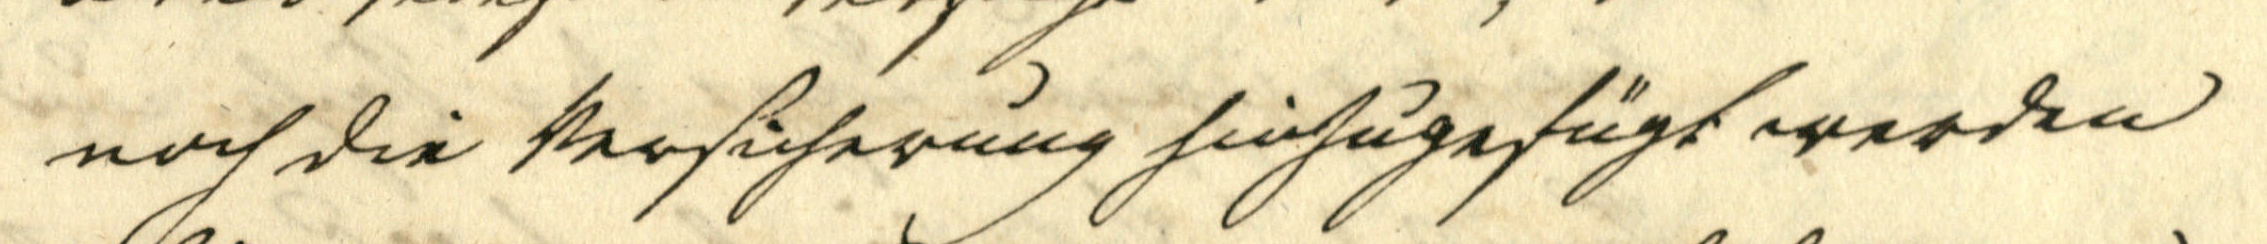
noch die Versicherung hinzugefügt werden
